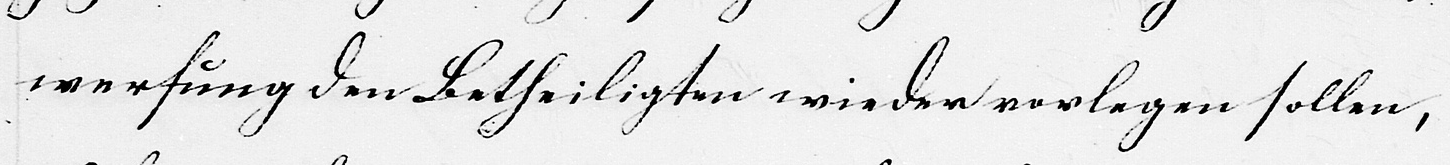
werfung den Betheiligten wieder vorlegen sollen,
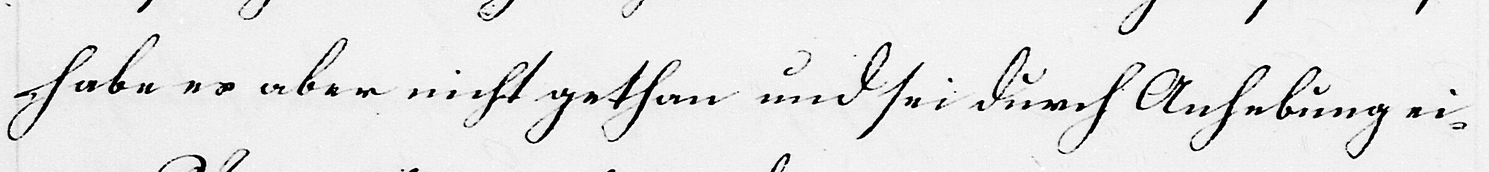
habe es aber nicht gethan und sei durch Anhebung ei¬
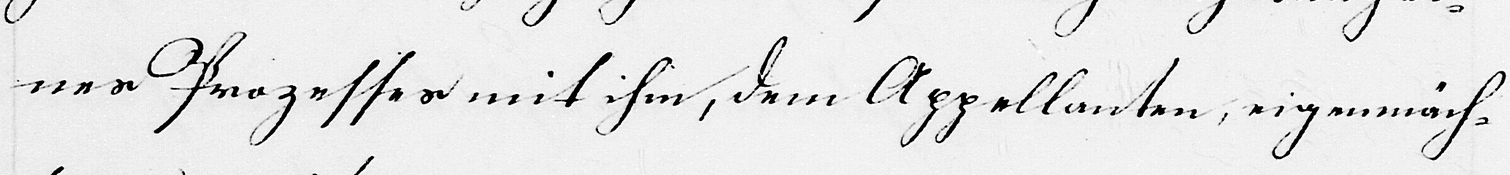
nes Prozesses mit ihm, dem Appellanten, eigenmäch¬
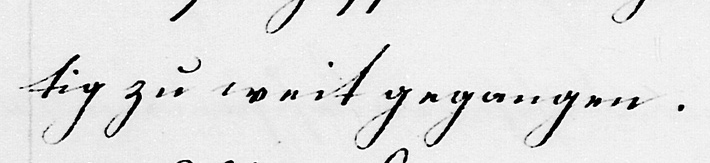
tig zu weit gegangen.
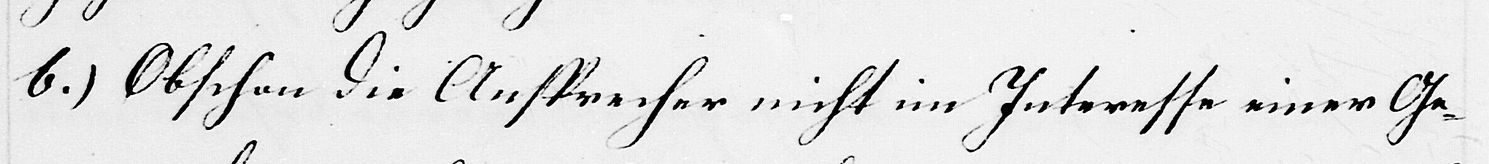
b.) Obschon die Ansprecher nicht im Interesse einer Ge¬
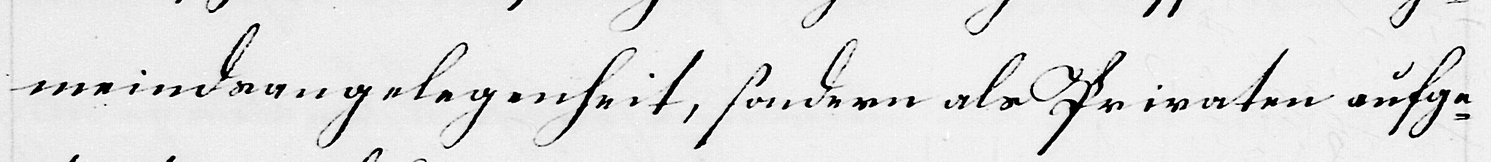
meindsangelegenheit, sondern als Privaten aufge¬
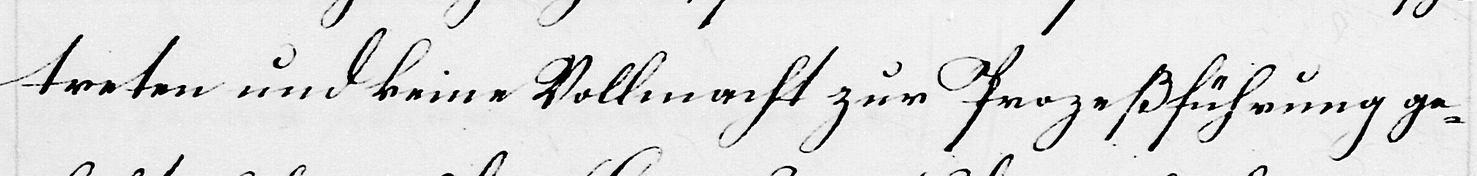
treten und keine Vollmacht zur Prozeßführung ge¬
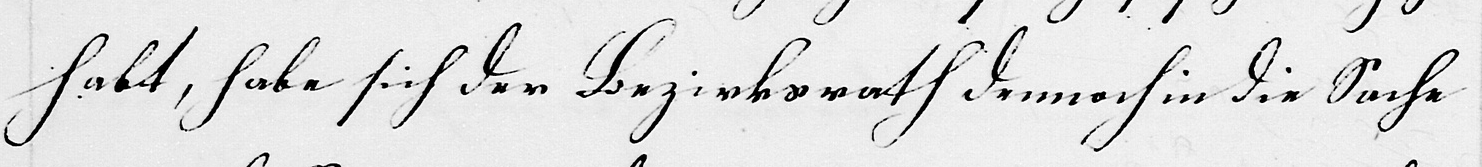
habt, habe sich der Bezirksrath dennoch in die Sache
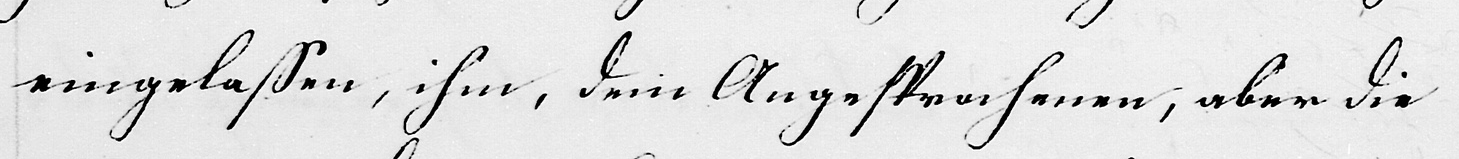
eingelaßen, ihm, dem Angesprochenen, aber die
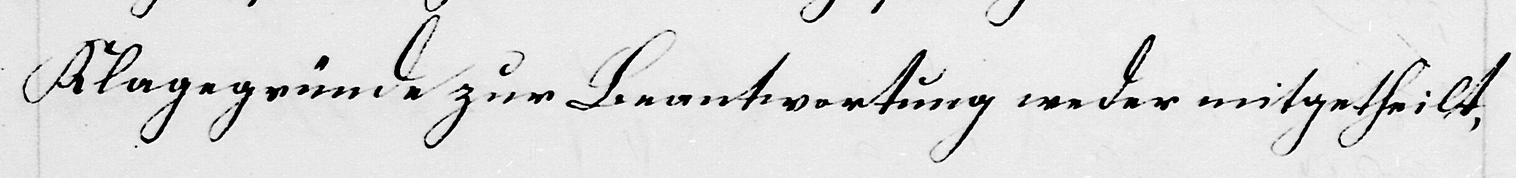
Klagegründe zur Beantwortung weder mitgetheilt,
